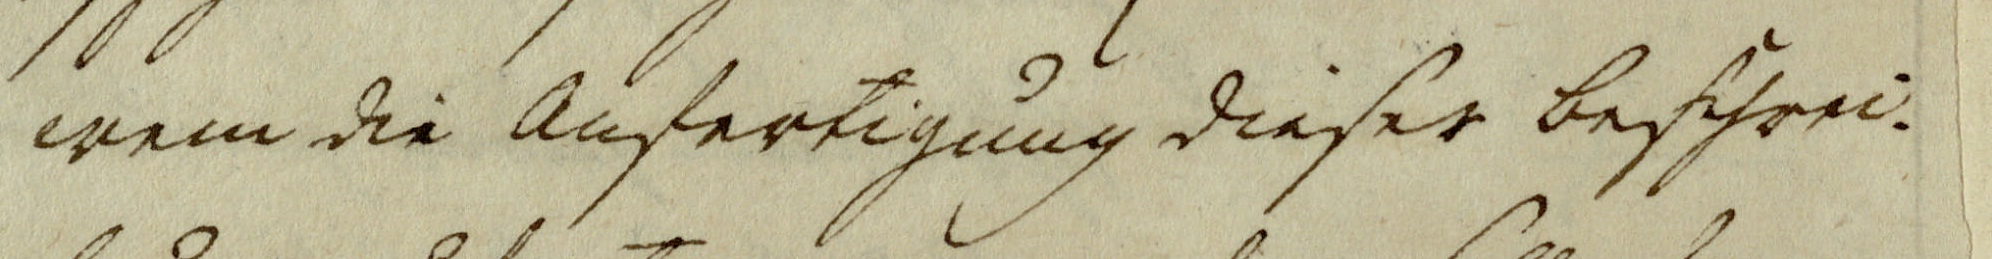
wem die Anfertigung dieser Beschrei¬
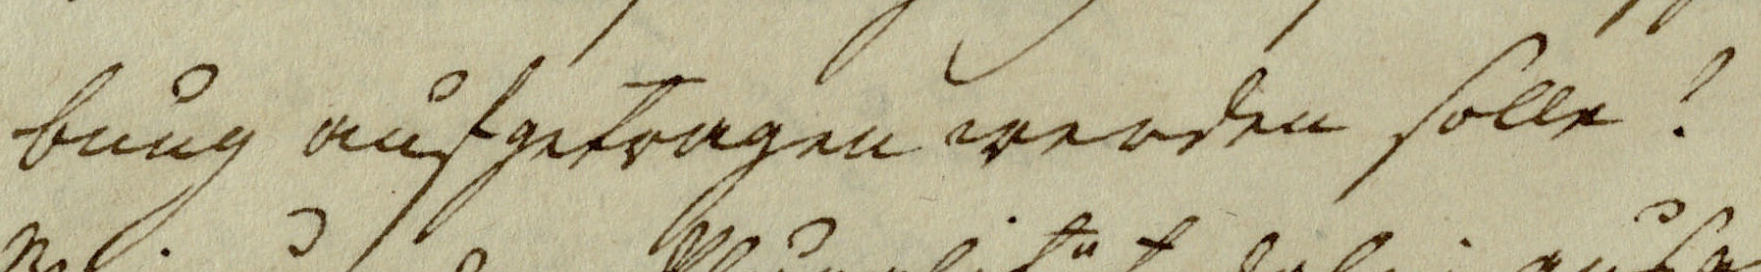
bung aufgetragen werden solle?
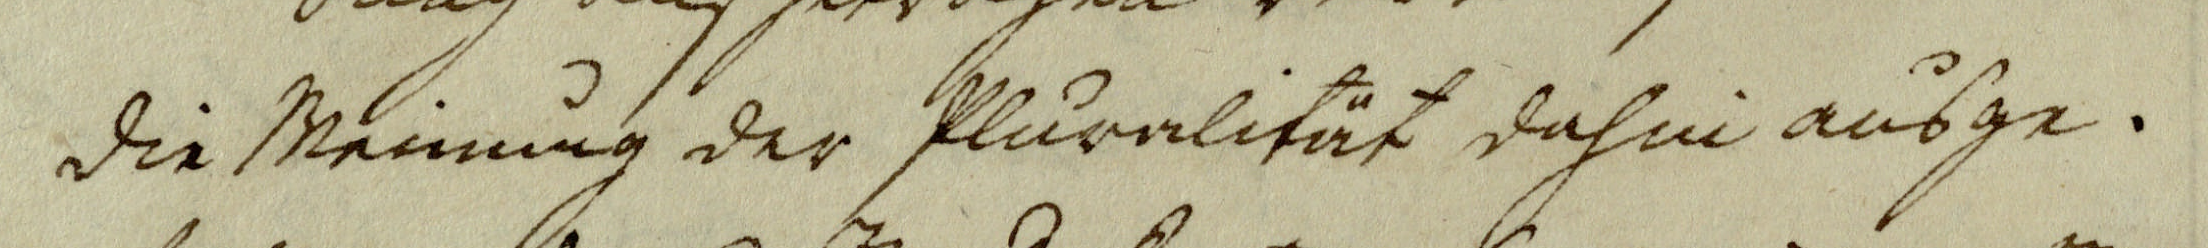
Die Meinung der Pluralität dahin ausge¬
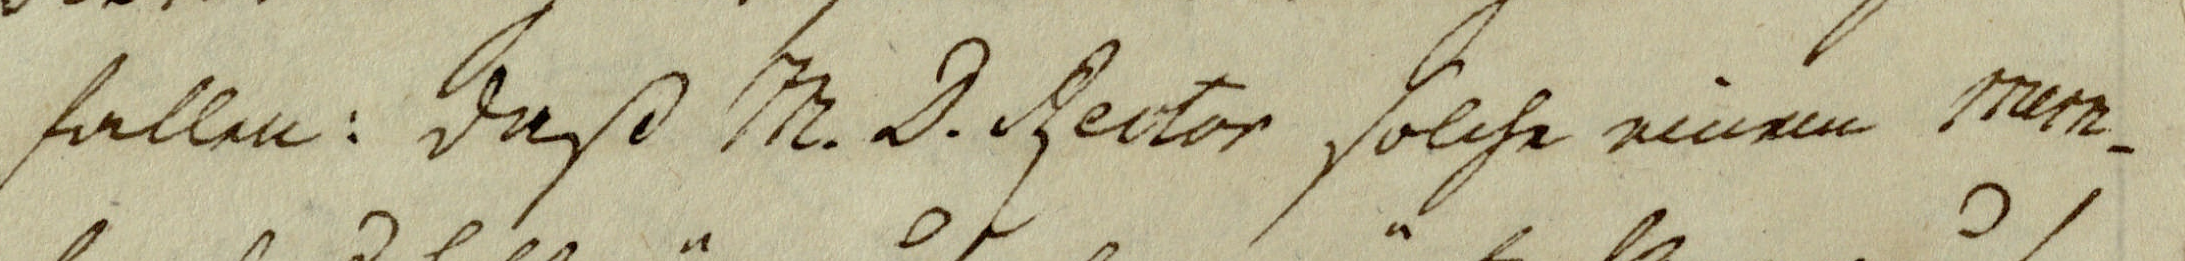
fallen: daß M. D. Rector solche einem Mem¬
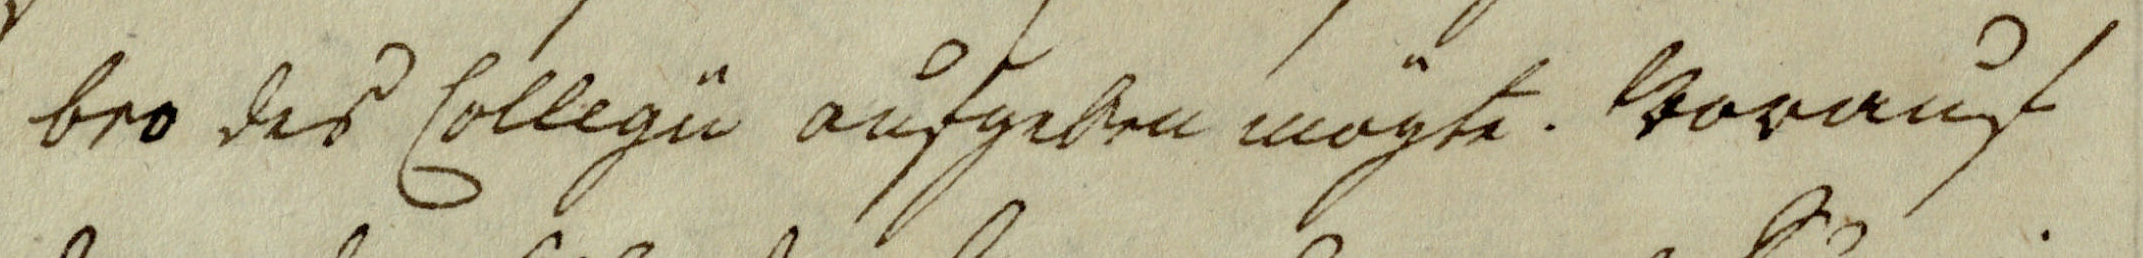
bro des Collegii aufgeben mögte. Worauf
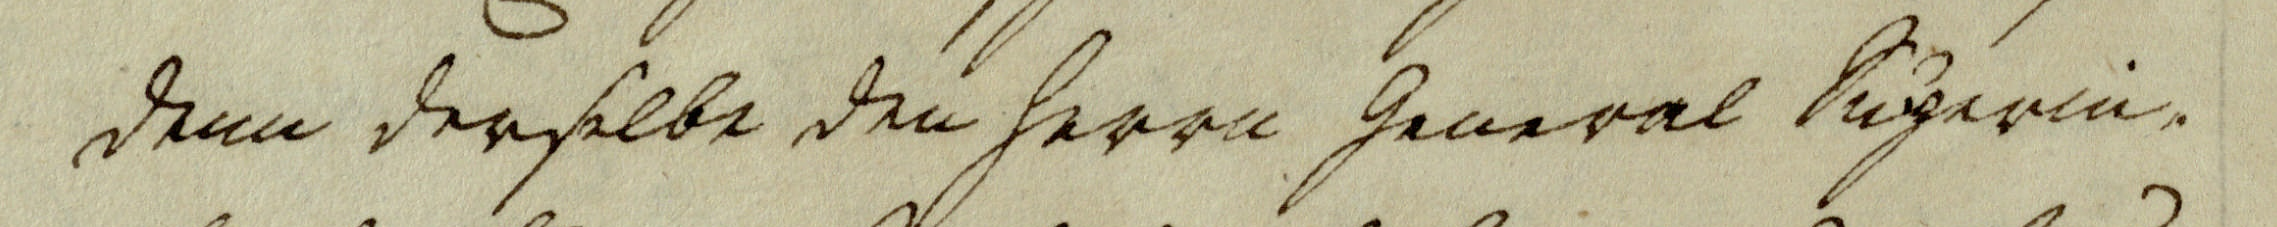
denn derselbe den Herrn General Superin¬
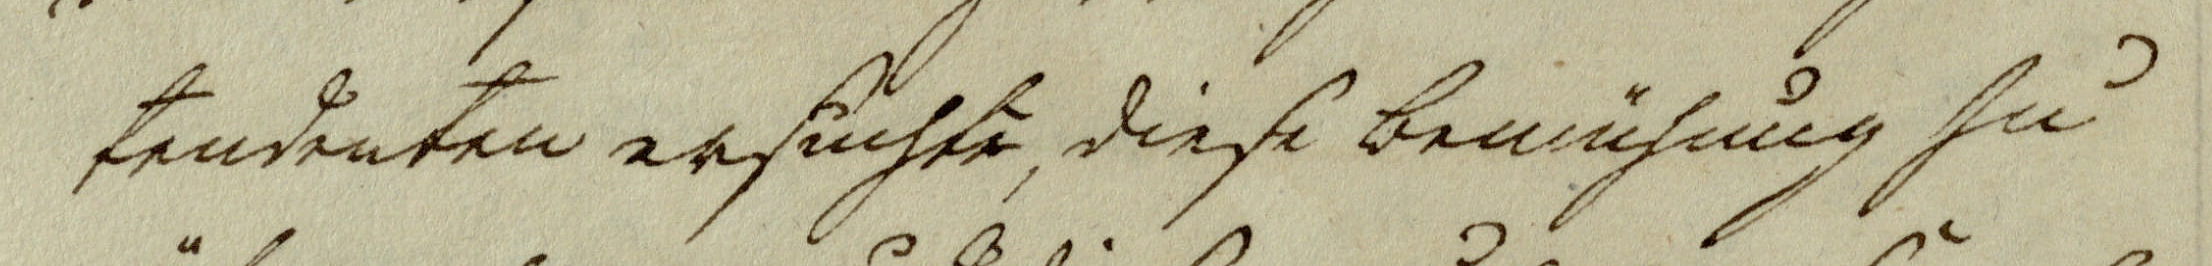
tendenten ersuchte, diese Bemühung zu
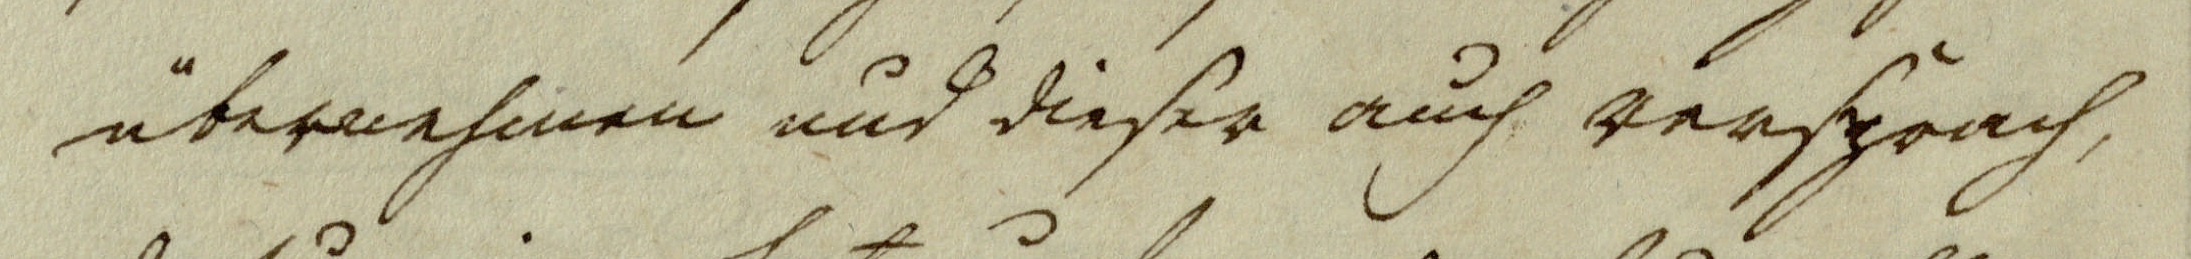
übernehmen und dieser auch versprach,
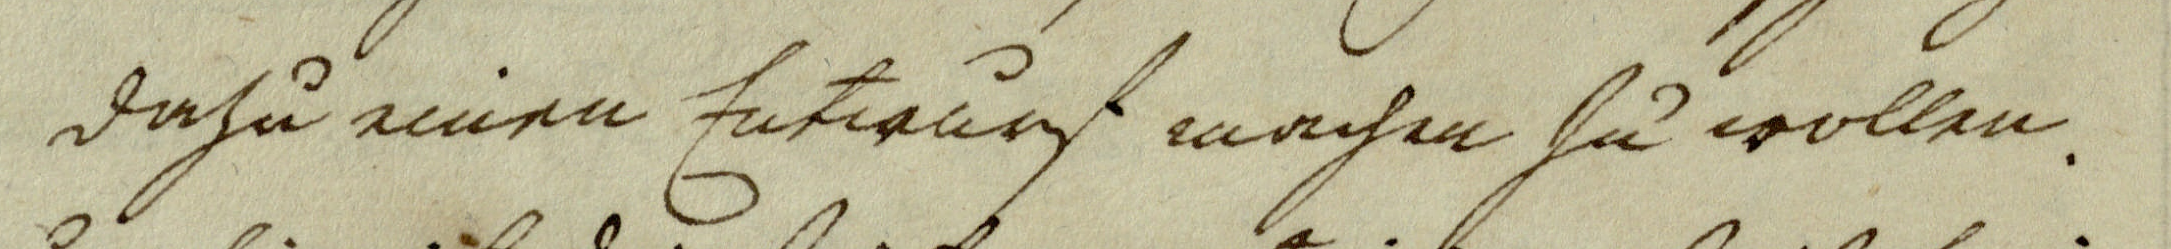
dazu einen Entwurf machen zu wollen.
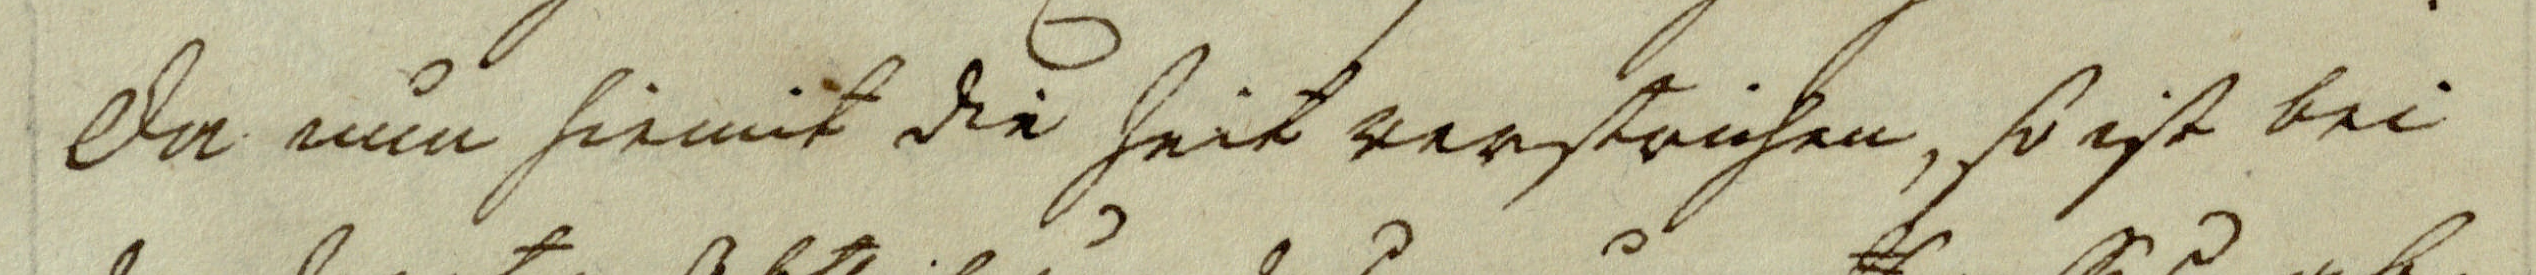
Da nun hiemit die Zeit verstrichen, so ist bei
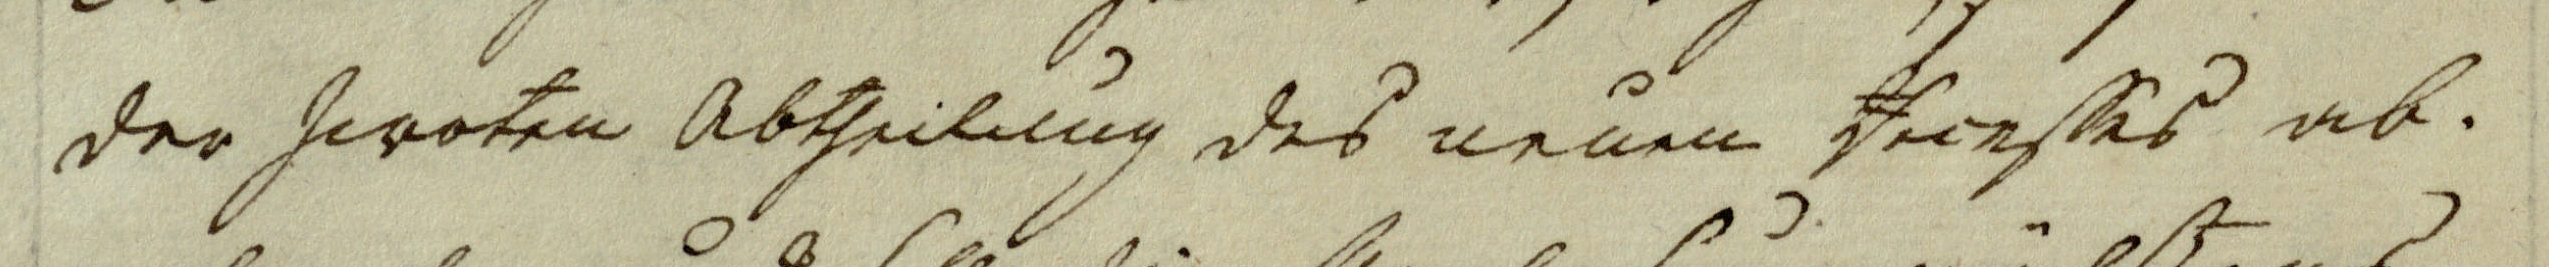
der zwoten Abtheilung des neuen Recesses ab¬
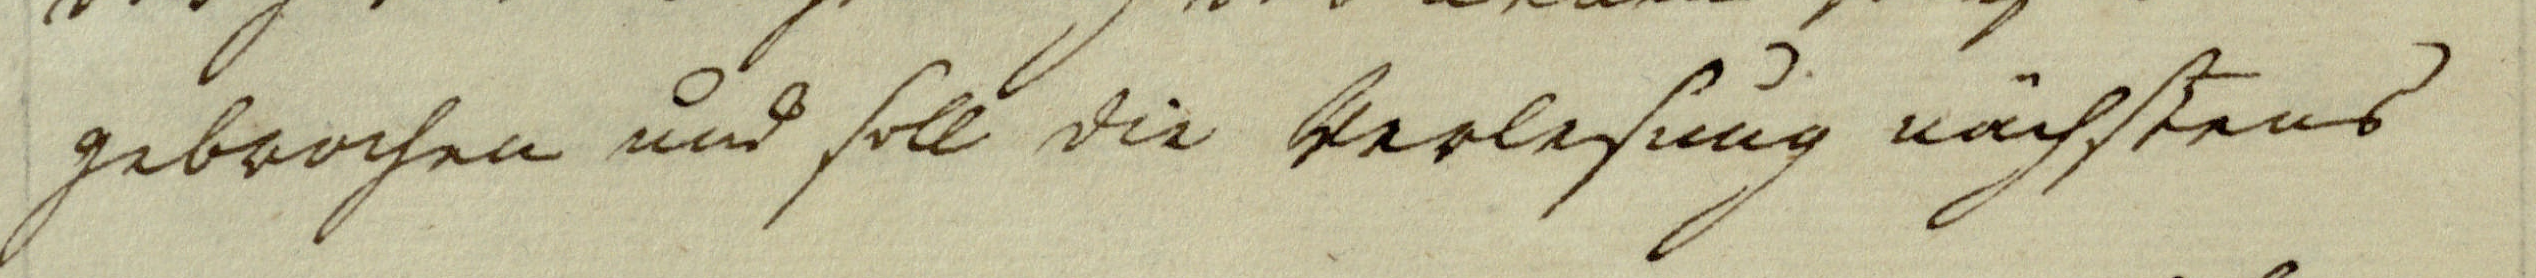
gebrochen und soll die Verlesung nächstens
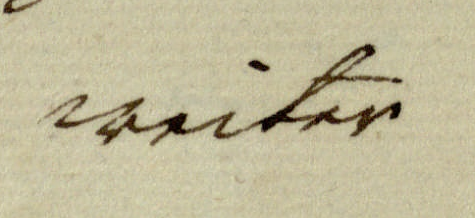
weiter
